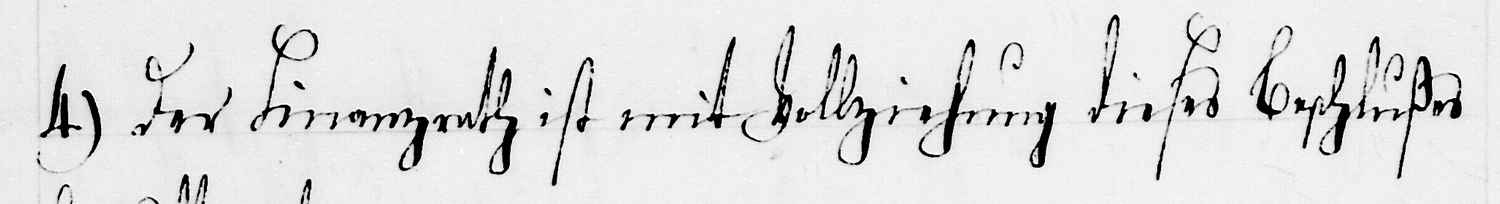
4.) Der Finanzrath ist mit Vollziehung dieses Beschlußes
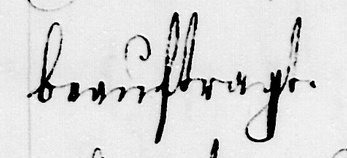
beauftragt.
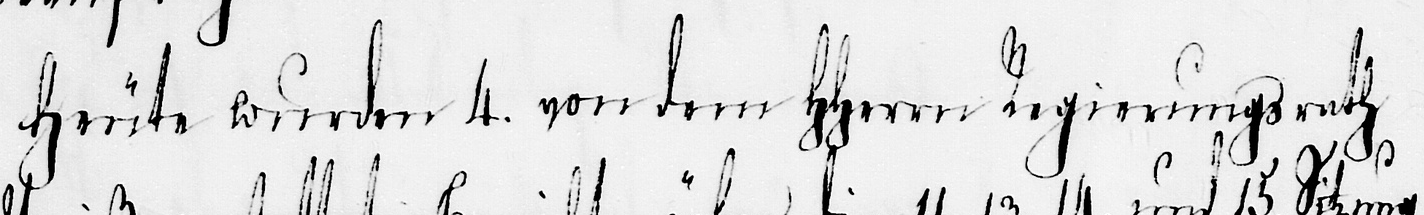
Heute wurden 4. von dem HHerrn Regierungsrath
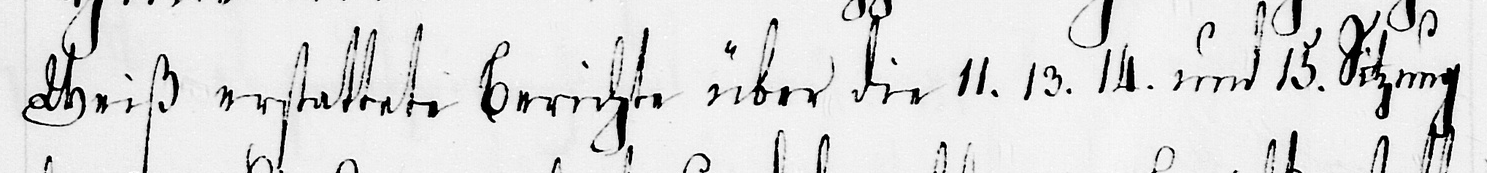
Weiß erstattete Berichte über die 11. 13. 14. und 15. Sitzung
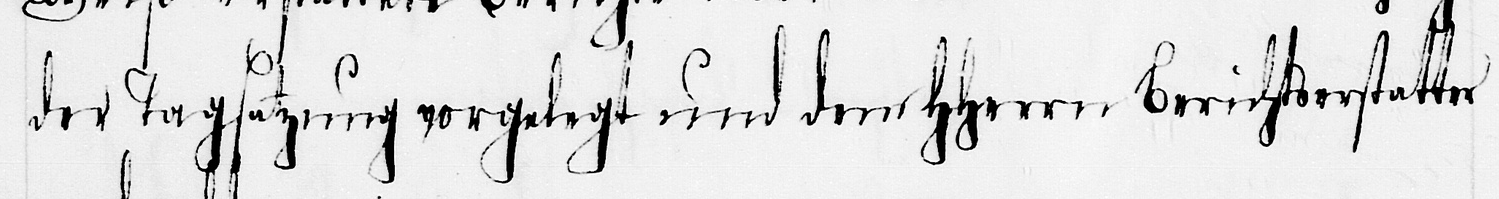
der Tagsatzung vorgelegt und dem HHerrn Berichtserstatter
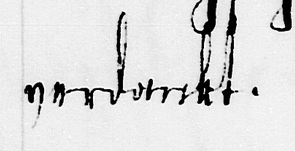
verdankt.
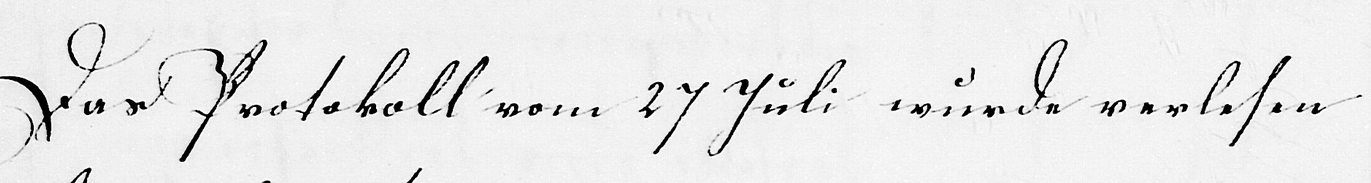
Das Protokoll vom 27 Juli wurde verlesen
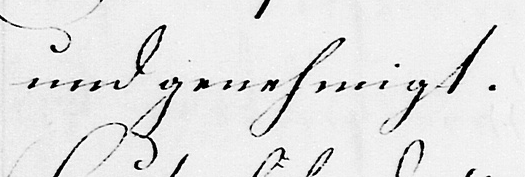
und genehmigt.
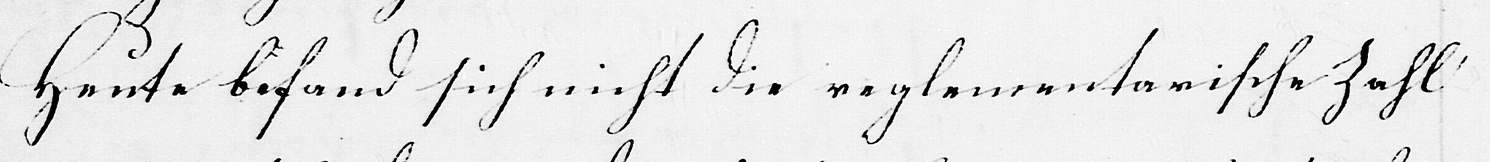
Heute befand sich nicht die reglementarische Zahl
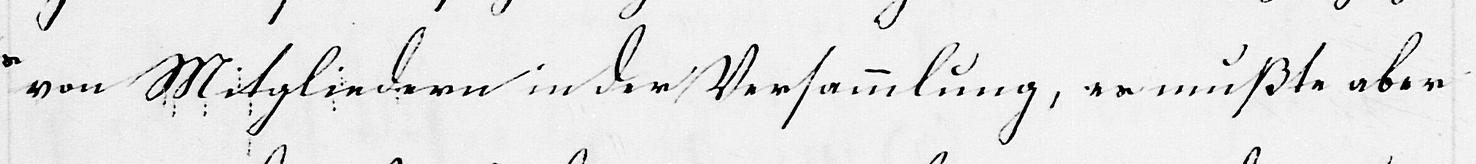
von Mitgliedern in der Versammlung, es mußte aber
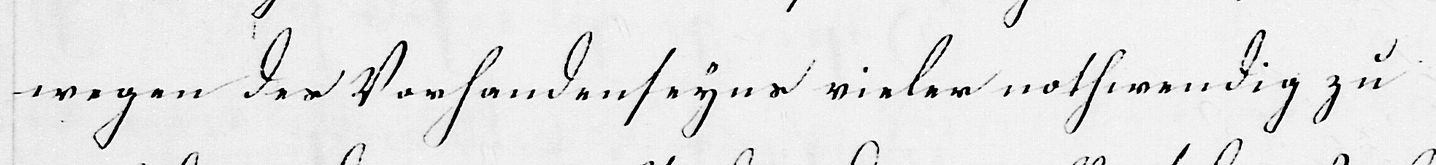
wegen des Vorhandenseyns vieler nothwendig zu
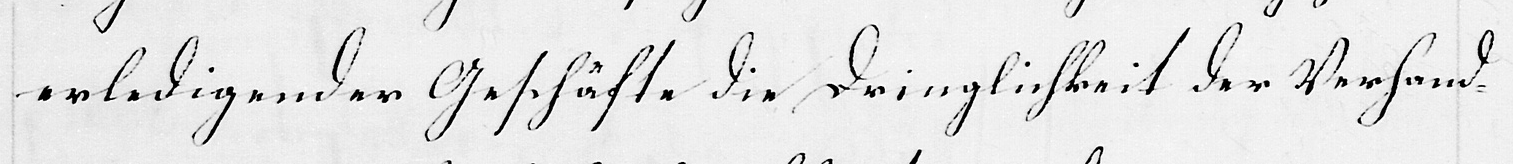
erledigender Geschäfte die Dringlichkeit der Verhand¬
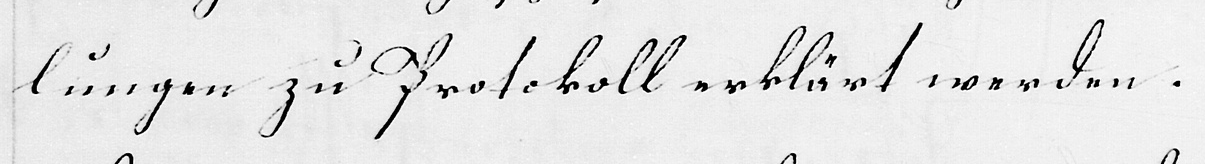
lungen zu Protokoll erklärt werden.
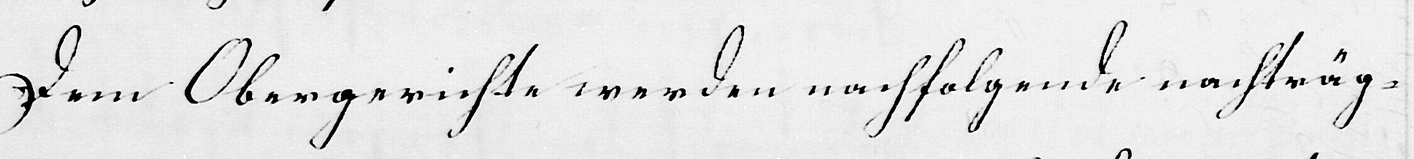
Dem Obergerichte werden nachfolgende nachträg¬
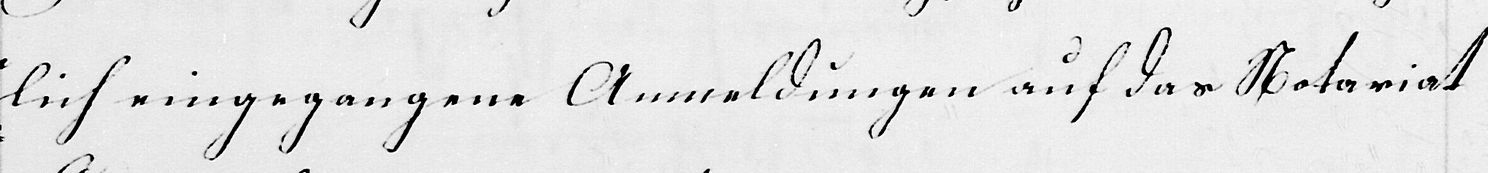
lich eingegangene Anmeldungen auf das Notariat
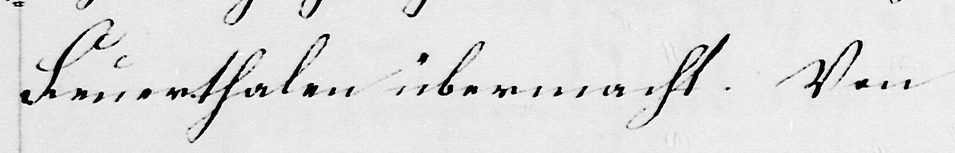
Feuerthalen übermacht. Von
